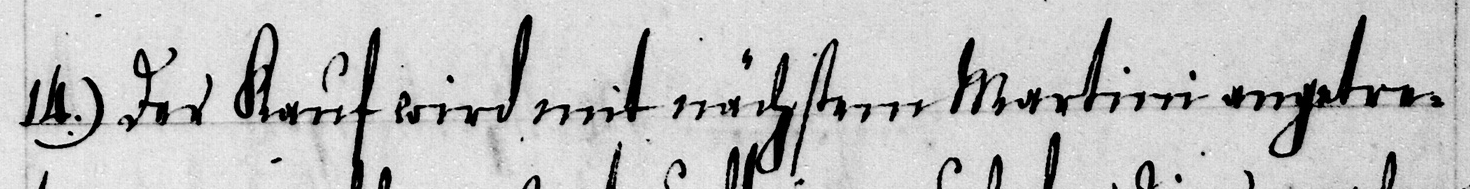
14.) Der Kauf wird mit nächstem Martini angetre¬
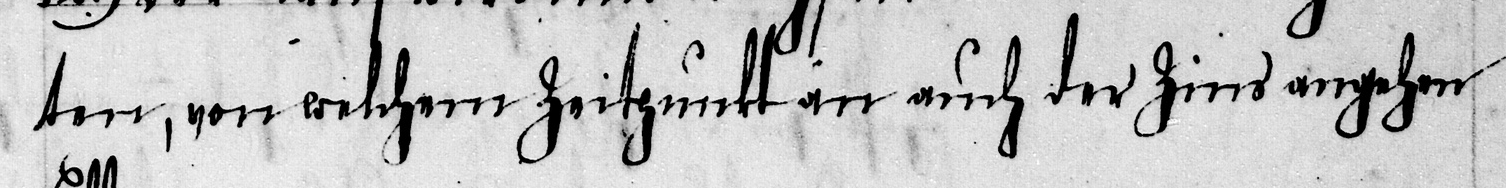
ten, von welchem Zeitpunkt an auch der Zins angehen
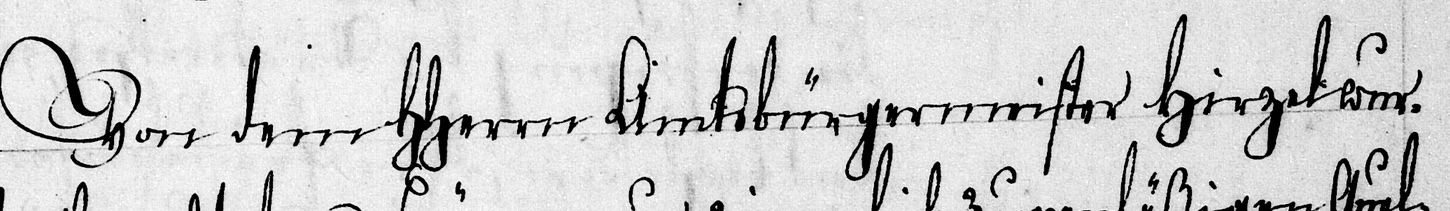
Von dem HHerrn Amtsbürgermeister Hirzel wur¬
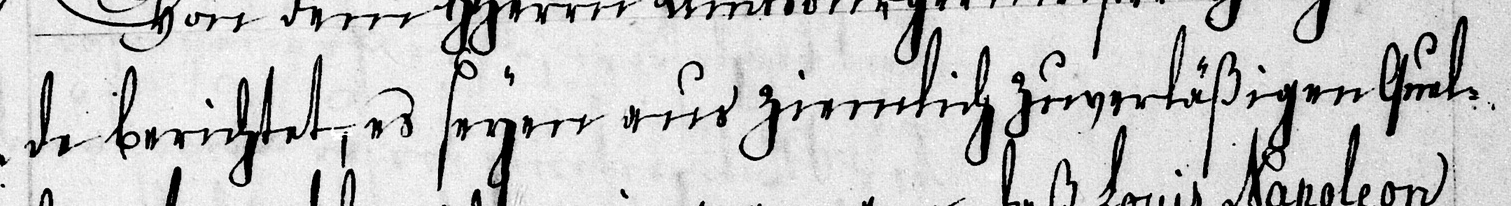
de berichtet, es seyen aus ziemlich zuverläßigen Quel¬
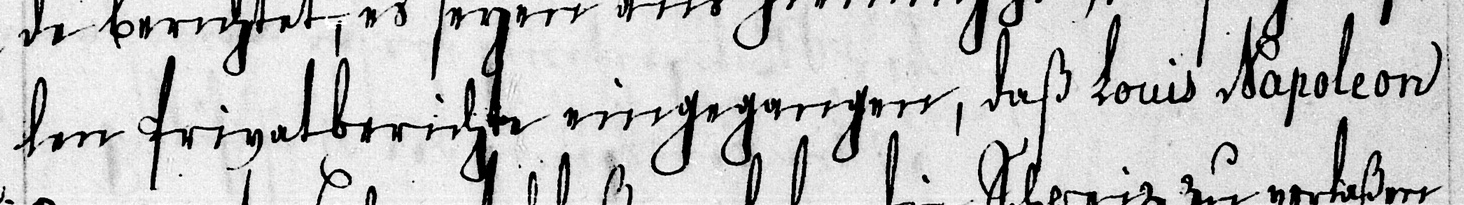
len Privatberichte eingegangen, daß Louis Napleon
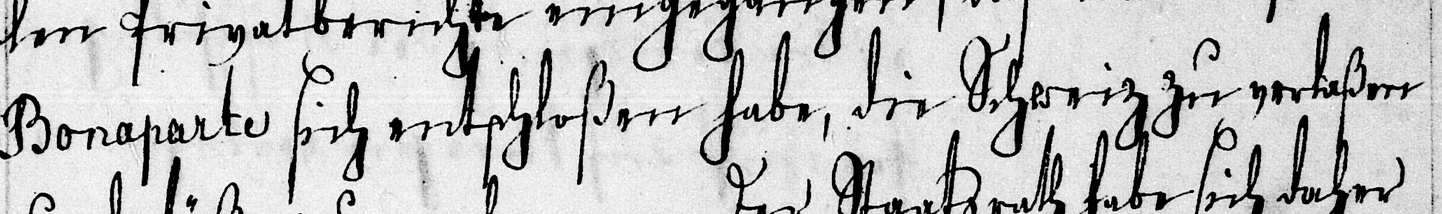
Bonaparte sich entschloßen habe, die Schweiz zu verlaßen
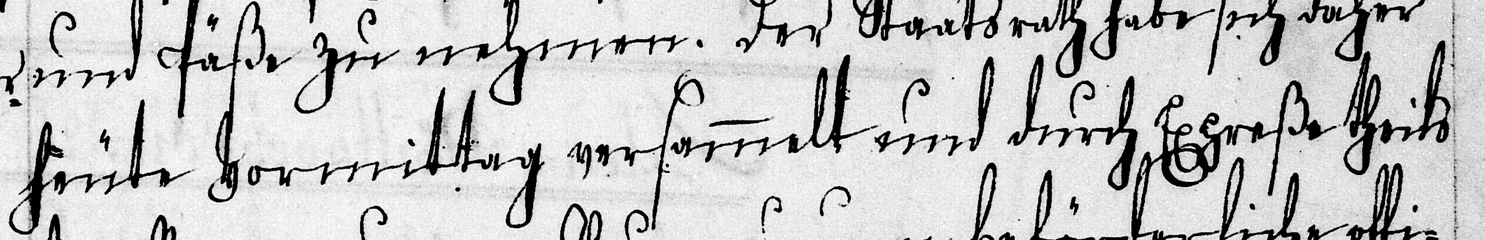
heute Vormittag versammelt und durch Expreße theils
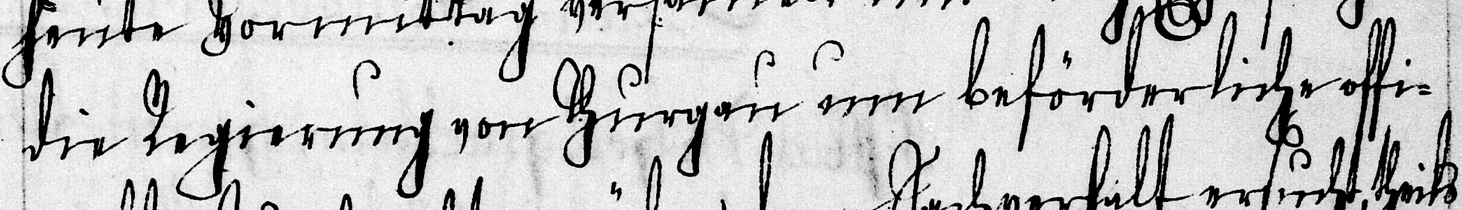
die Regierung von Thurgau um beförderliche offi¬
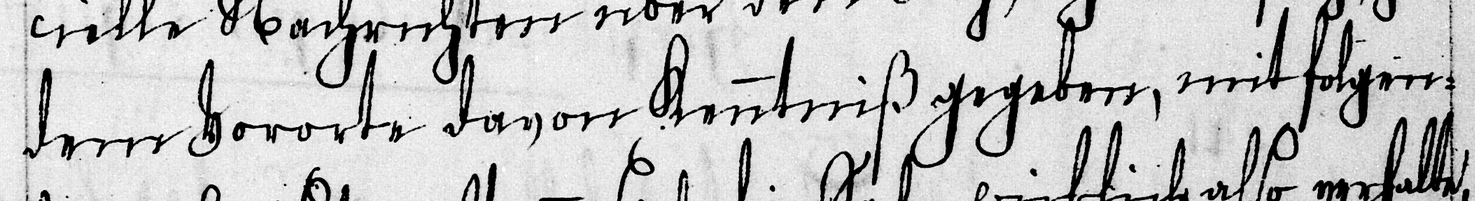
dem Vororte davon Kenntniß gegeben, mit folgen¬
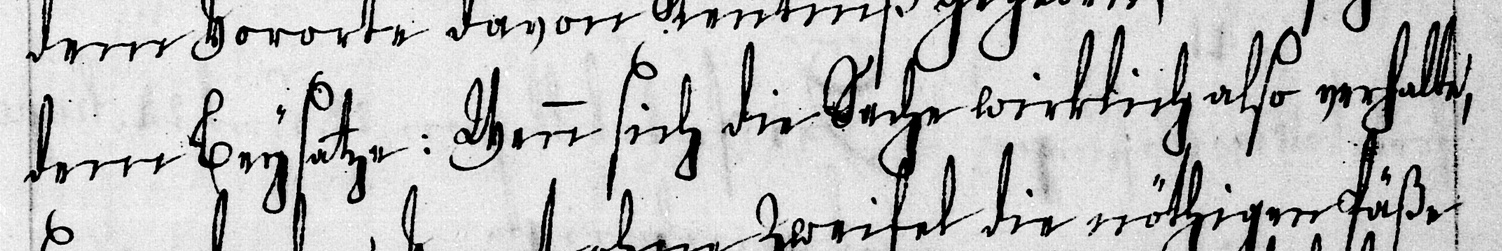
dem Beysatze: Wenn sich die Sache wirklich also verhal¬
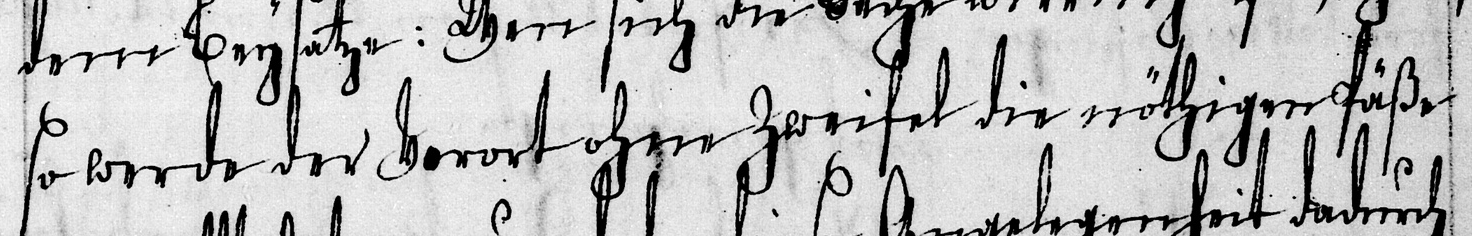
so werde der Vorort ohne Zweifel die nöthigen Päße
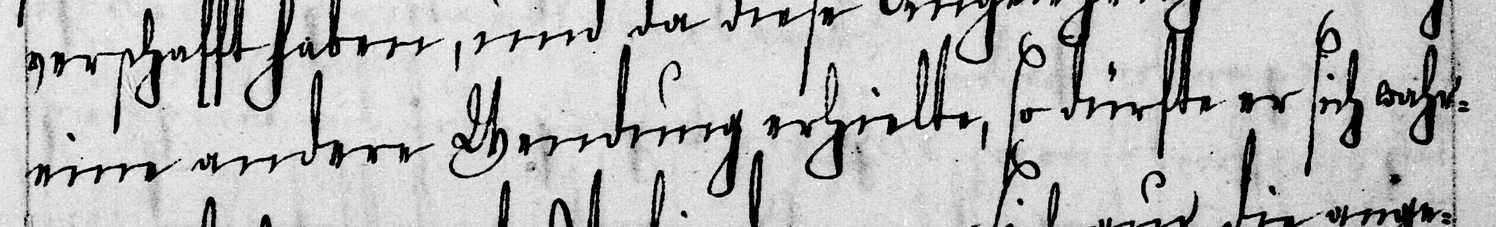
eine andere Wendung erhielte, so dürfte er sich wahr¬
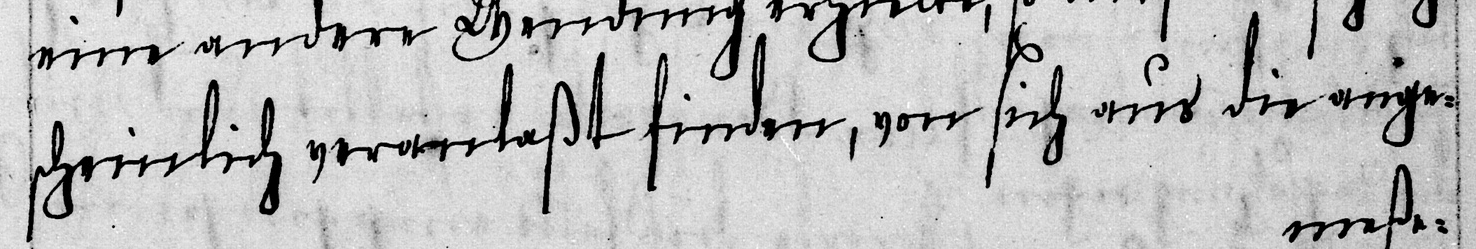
scheinlich veranlaßt finden, von sich aus die ange-
